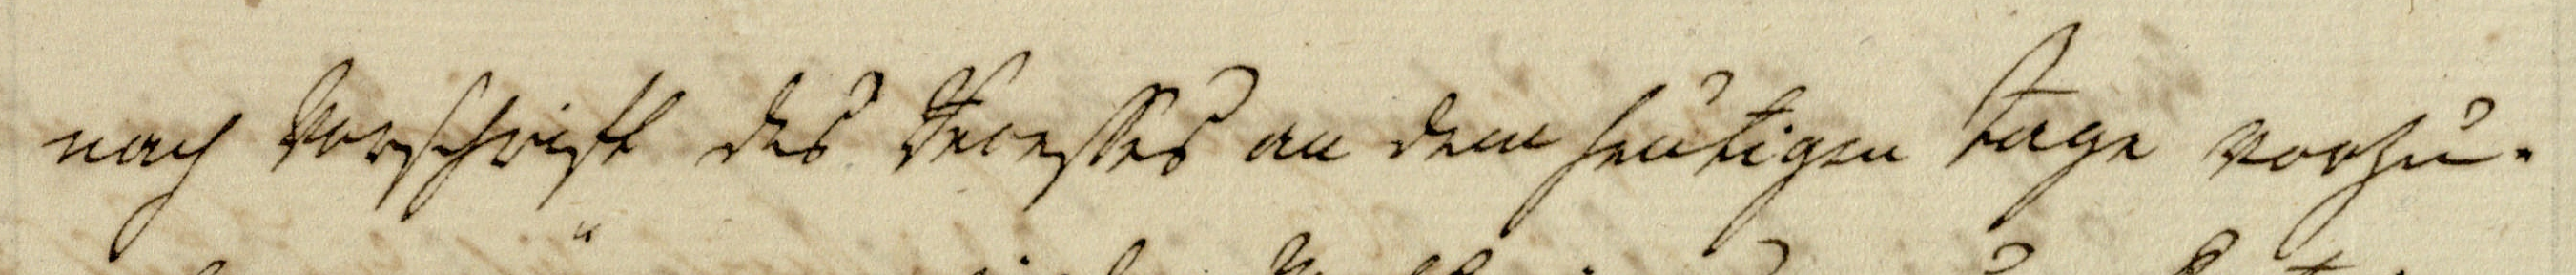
nach Vorschrift des Recesses an dem heutigen Tage vorzu¬
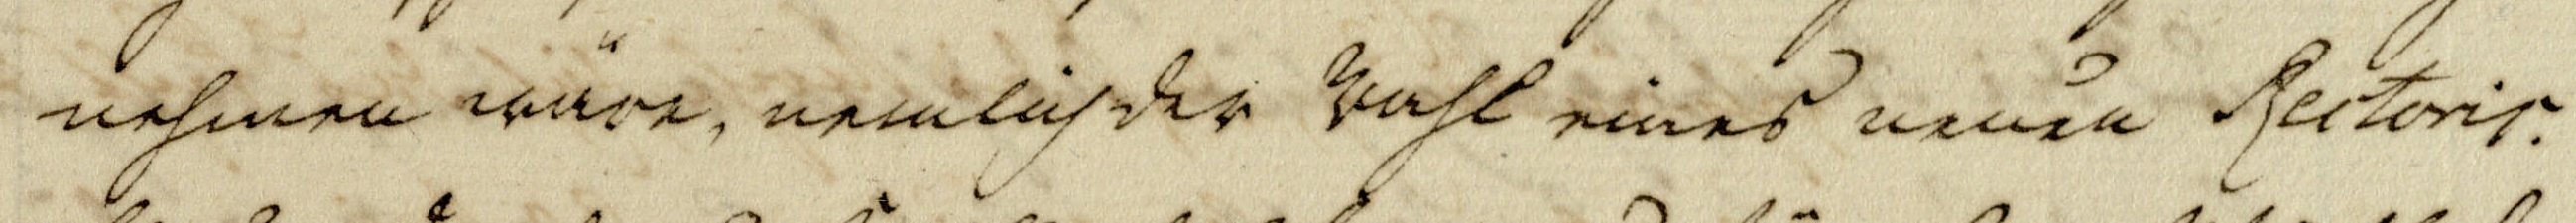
nehmen wäre, nemlich der Wahl eines neuen Rectoris.
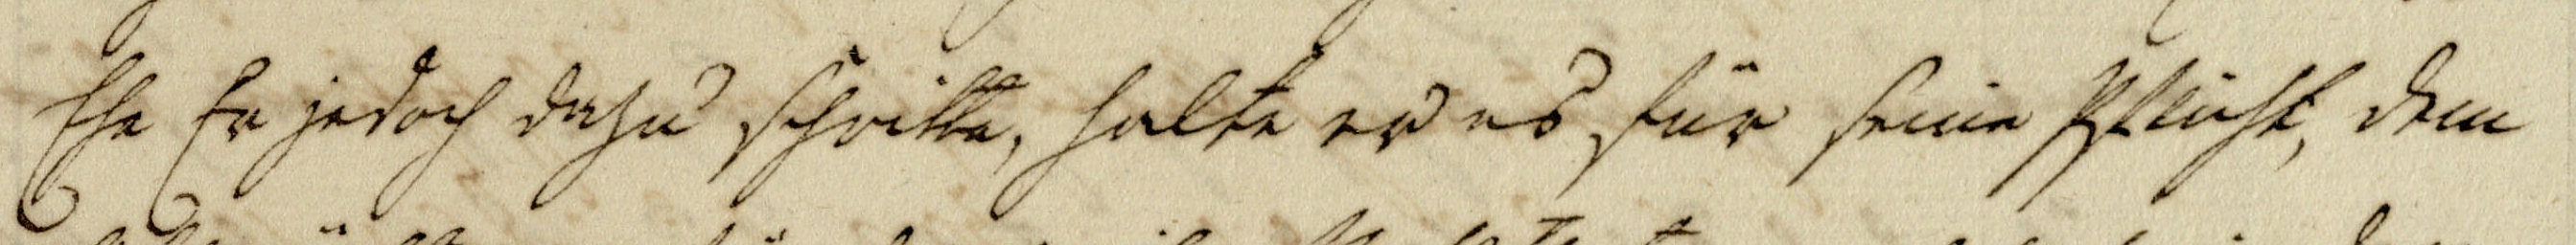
Ehe Er jedoch dazu schritte, halte er es für seine Pflicht, dem
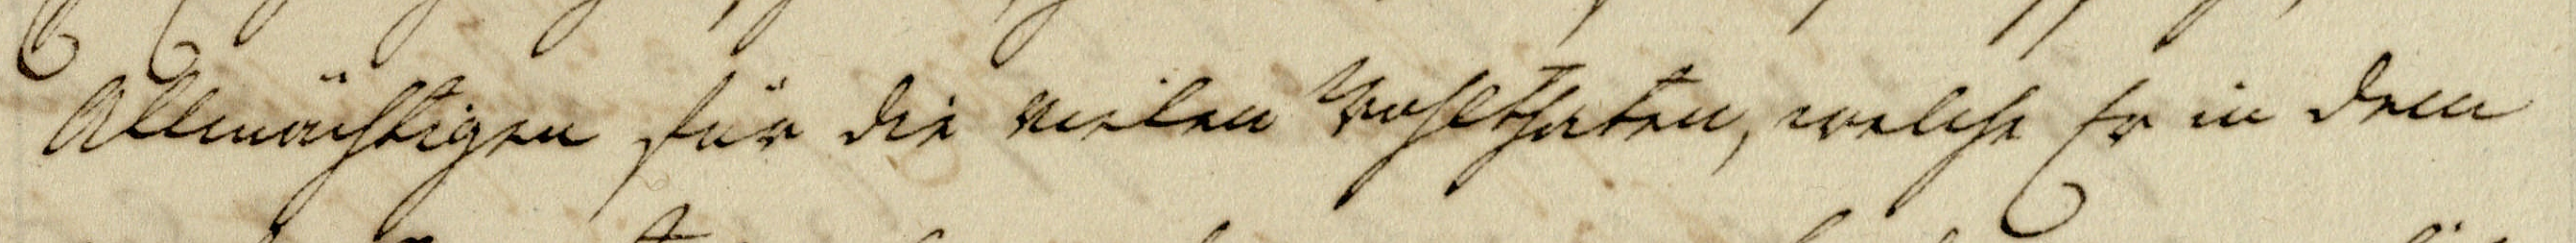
Allmächtigen für die vielen Wohlthaten, welche Er in dem
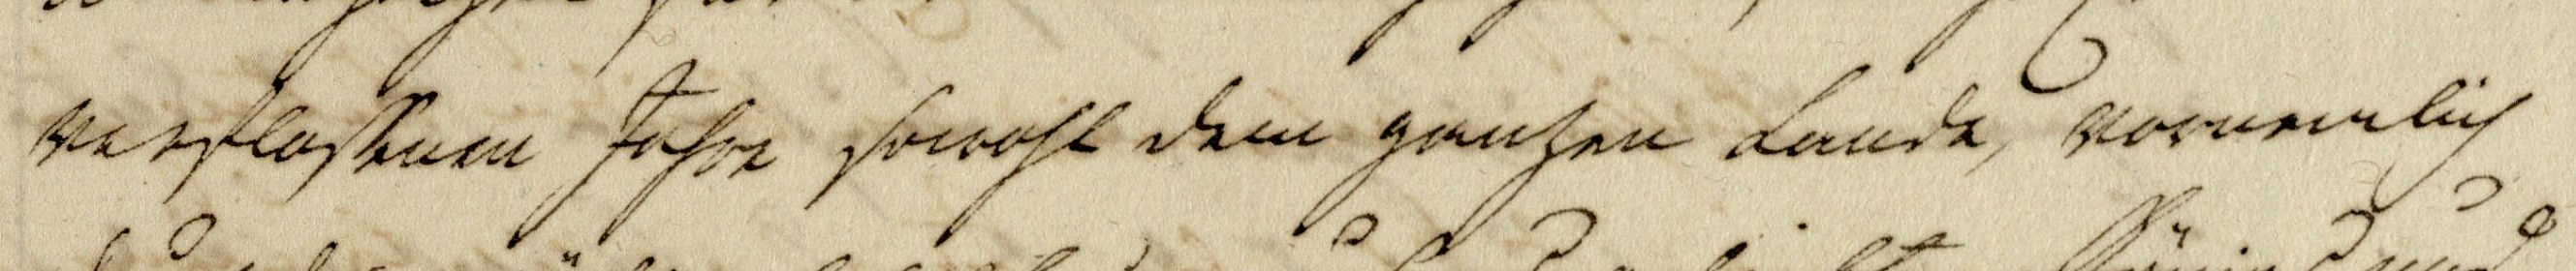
verflossenen Jahre sowohl dem ganzen Lande, vornemlich
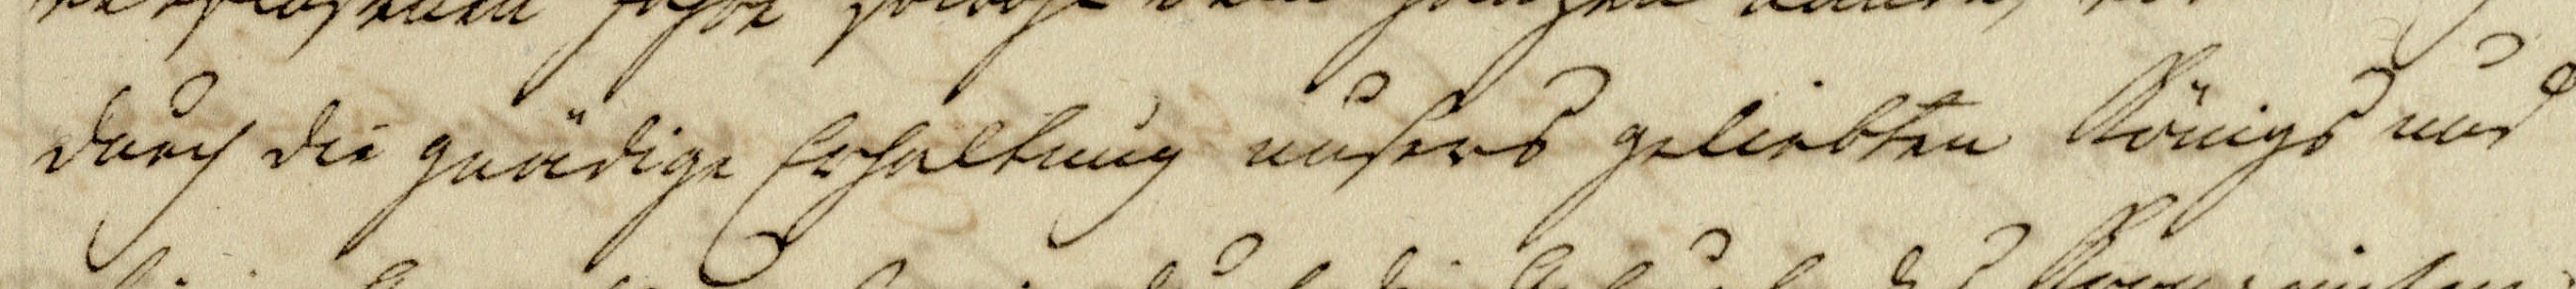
durch die gnädige Erhaltung unsers geliebten Königs und
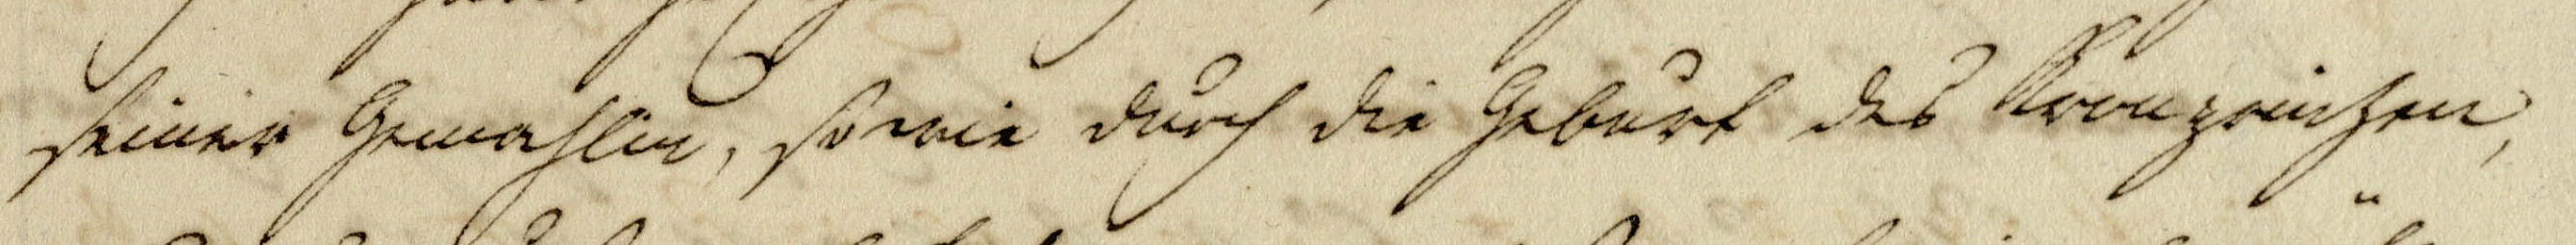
seiner Gemahlin, sowie durch die Geburt des Kronprinzen,
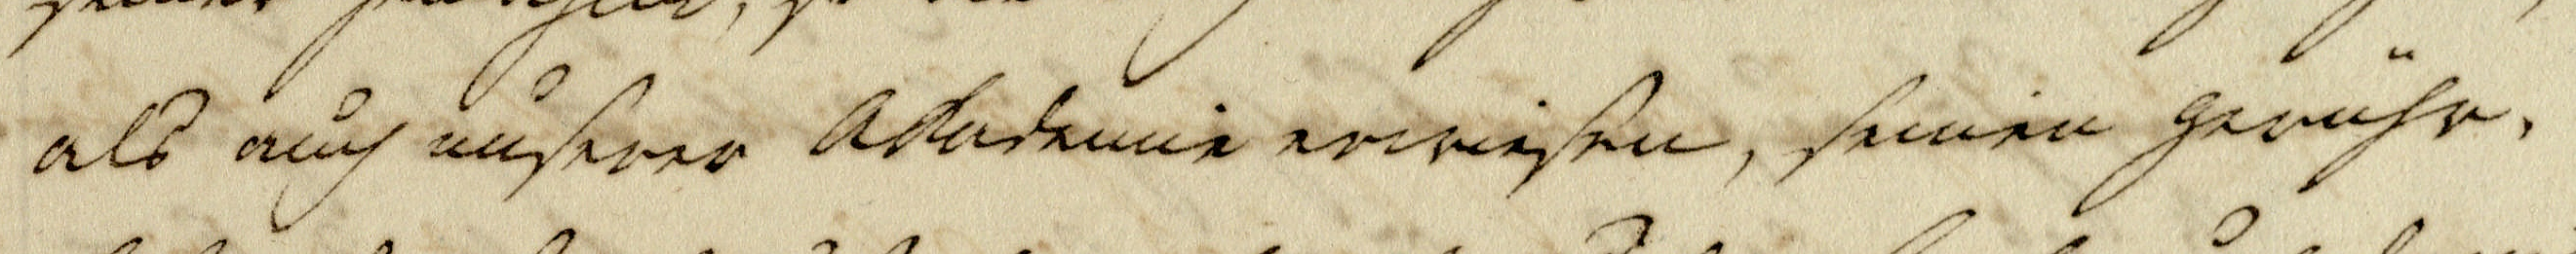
als auch unserer Akademie erwiesen, seinen gerühr¬
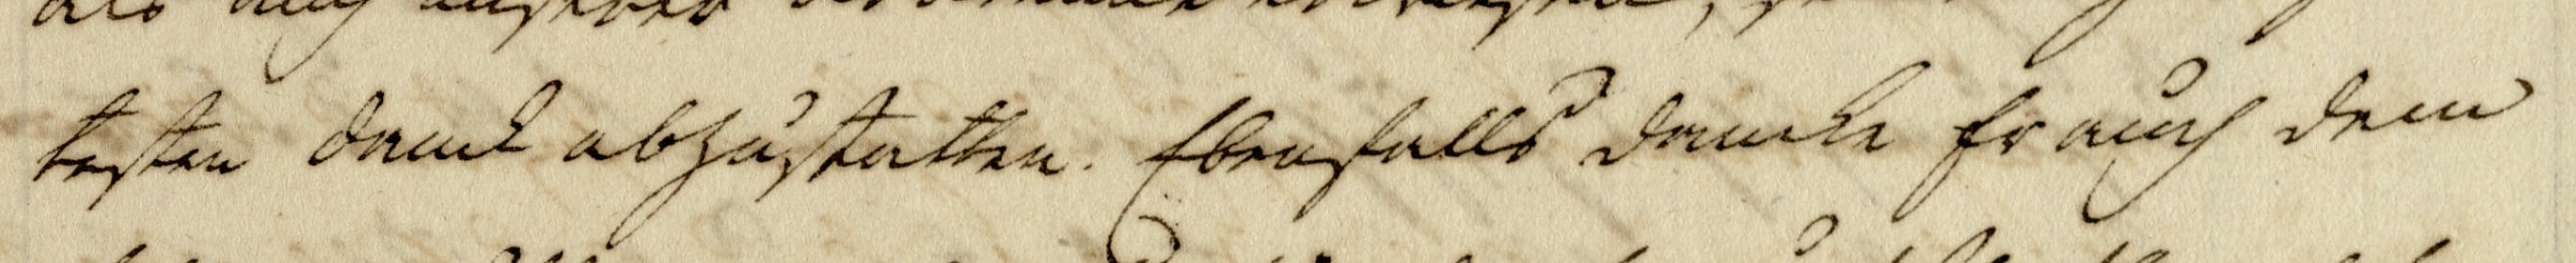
testen Danck abzustatten. Ebenfalls dancke Er auch dem
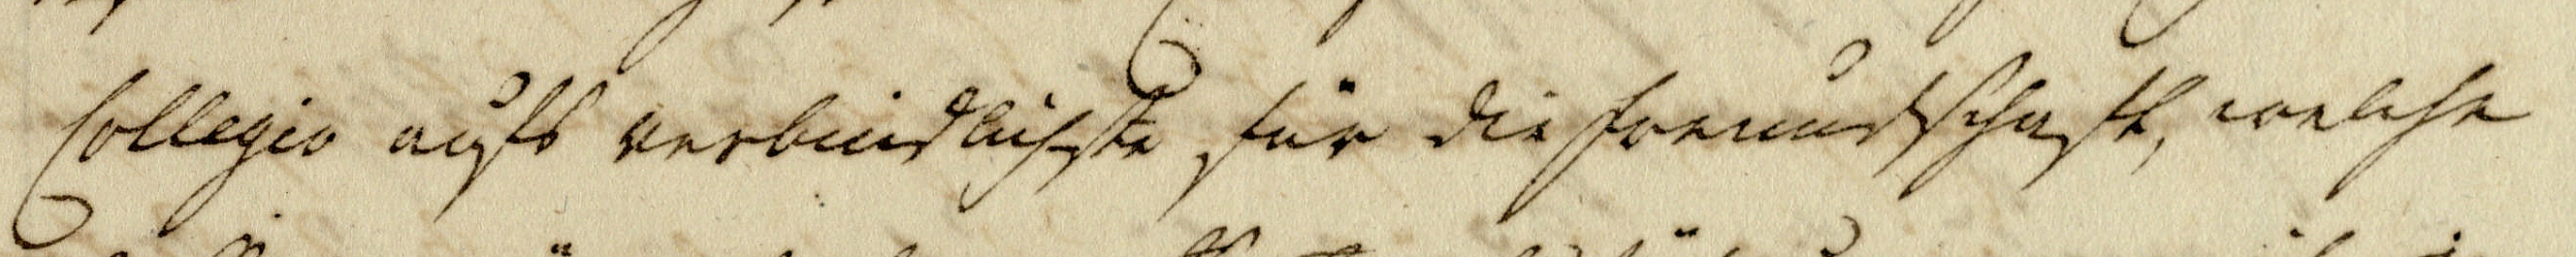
Collegio aufs verbindlichste für die Freundschaft, welche
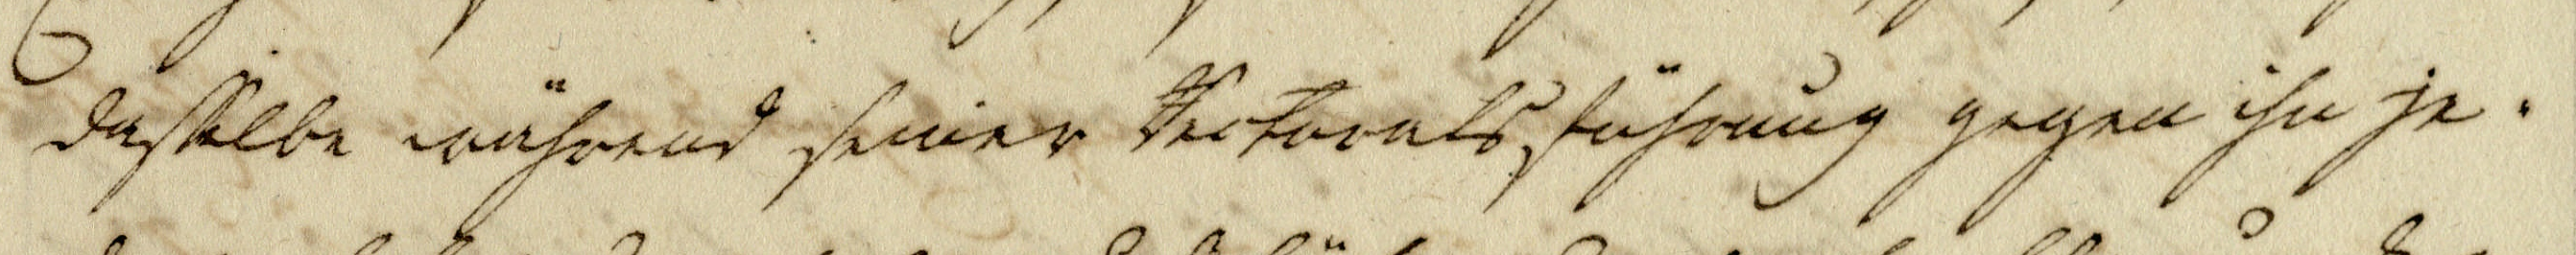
dasselbe während seiner Rectoratsführung gegen ihn je¬
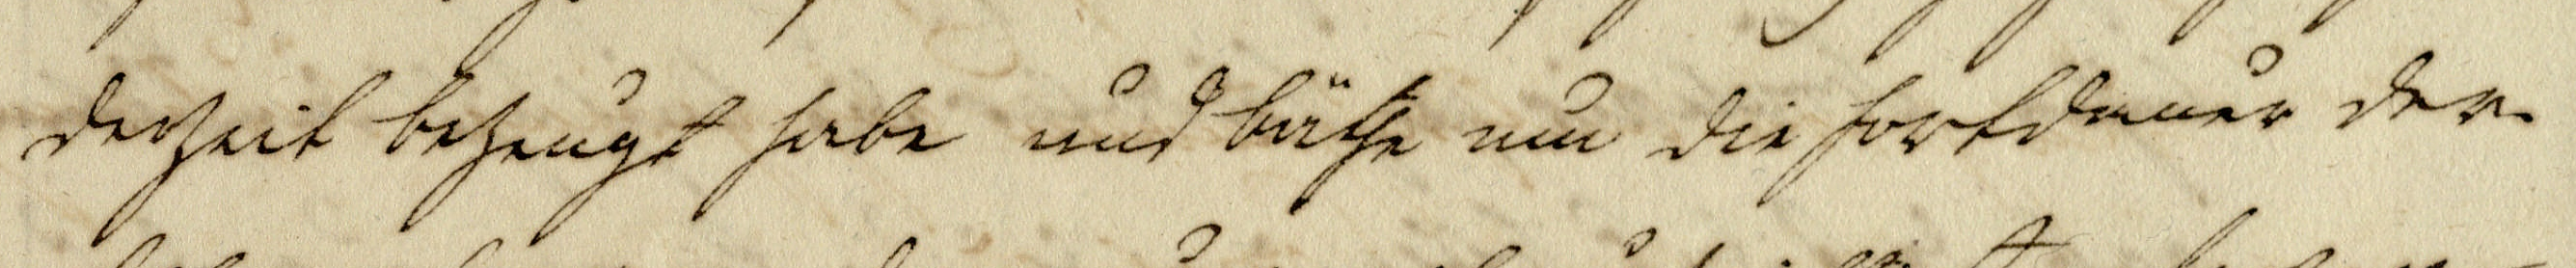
derzeit bezeugt habe und bäthe um die Fortdauer der¬
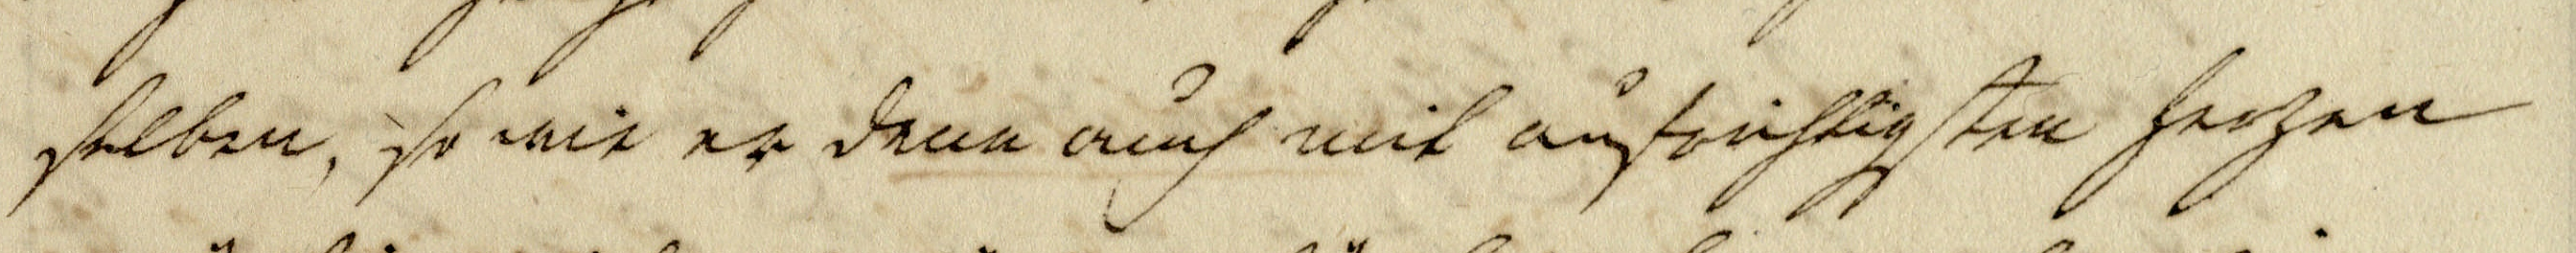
selben, so wie er denn auch mit aufrichtigsten Herzen
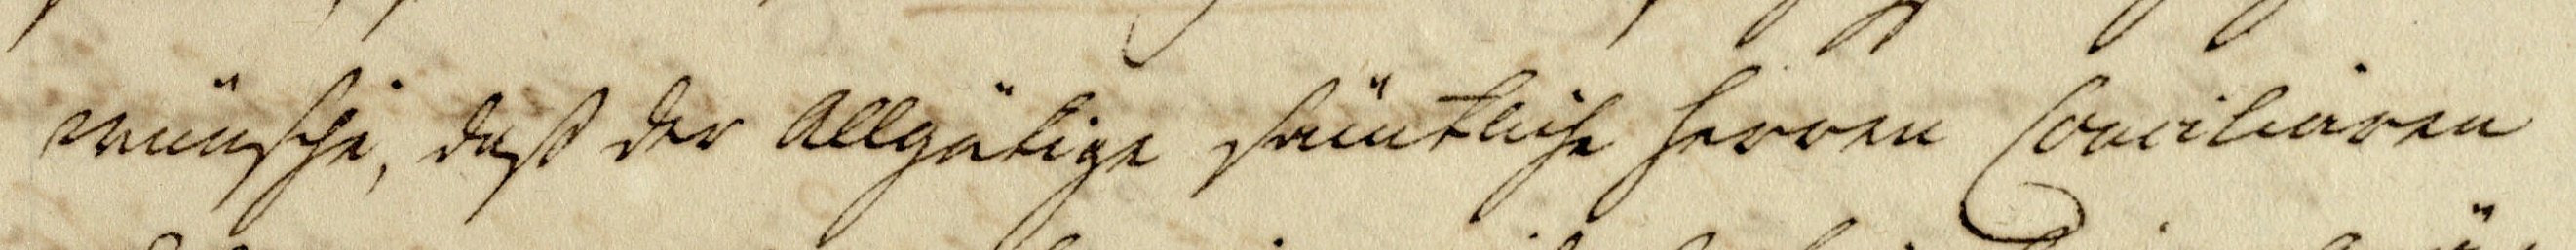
wünsche, daß der Allgütige sämtliche Herren Conciliaren
